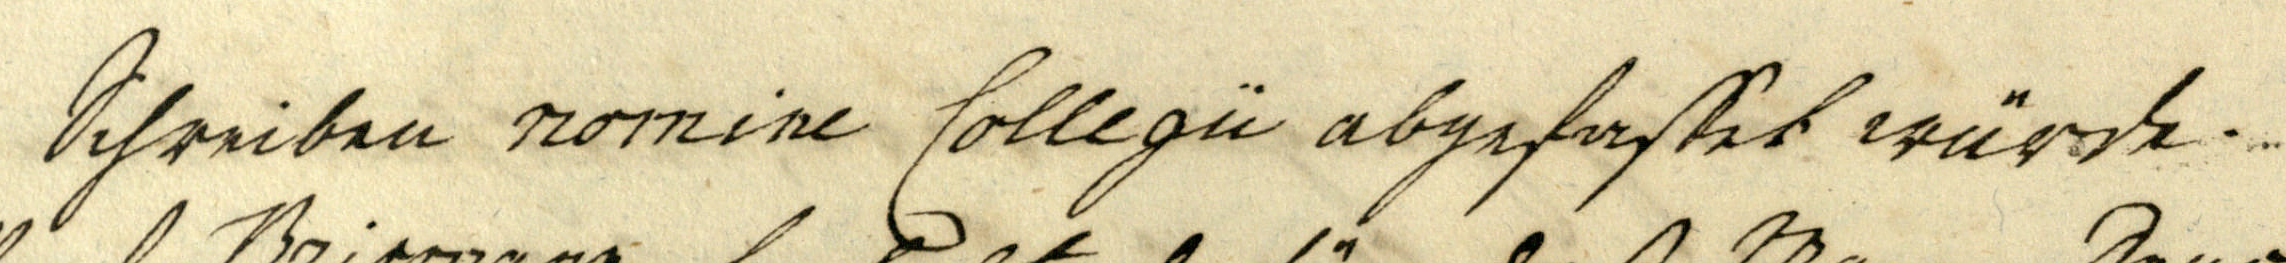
Schreiben nomine Collegii abgefasset würde.
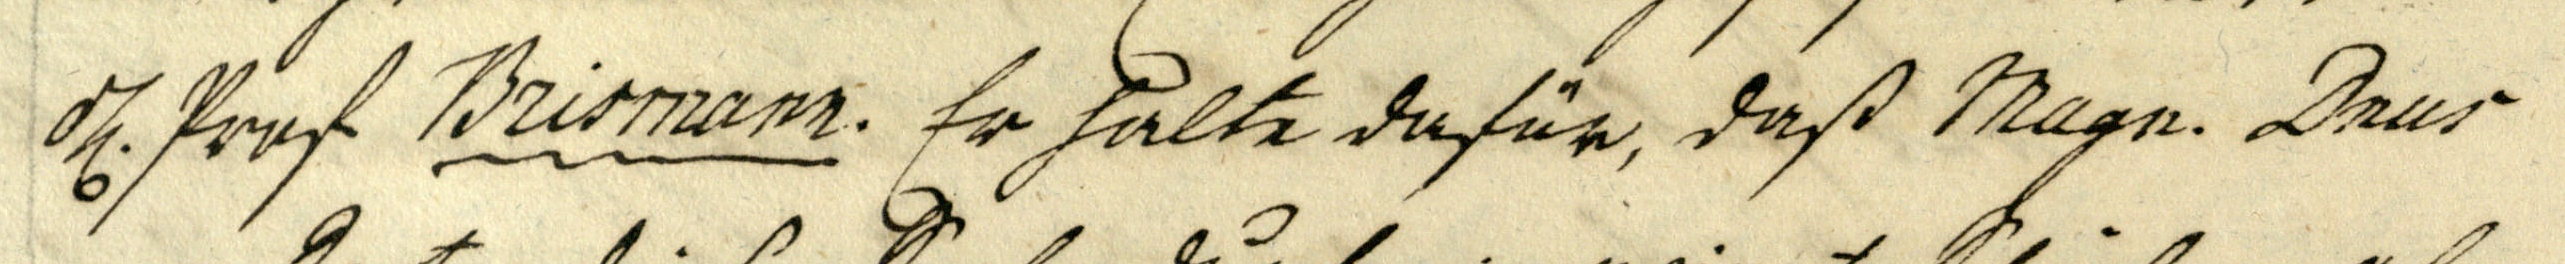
dh. Prof. Brismann. Er halte dafür, daß Magn. Dnus
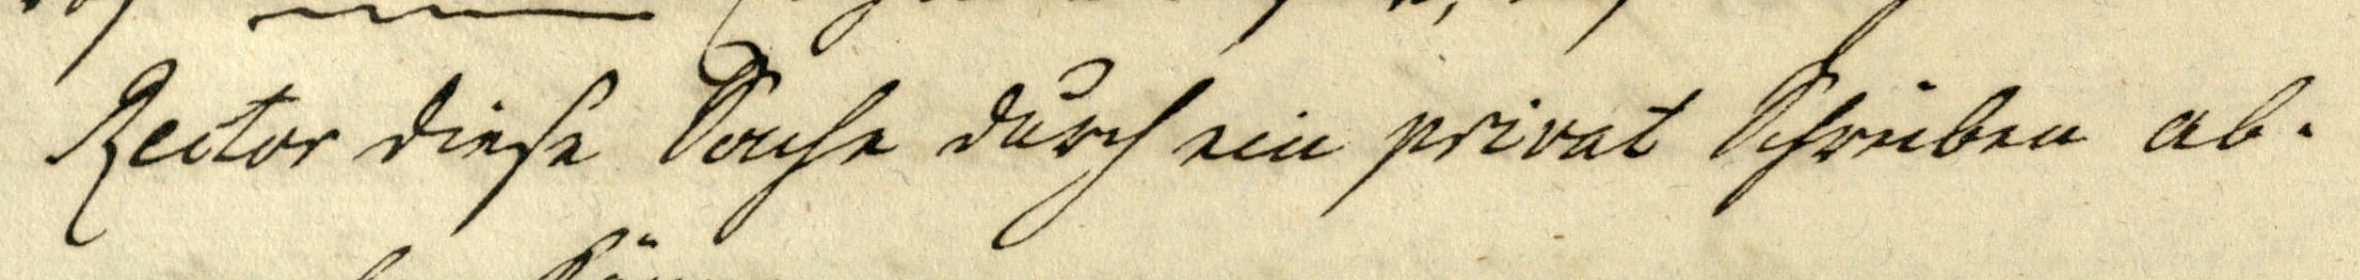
Rector diese Sache durch ein privat Schreiben ab-
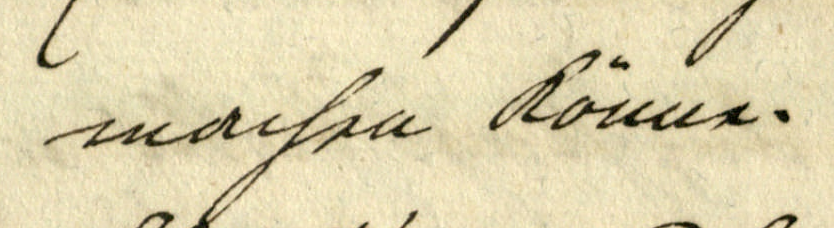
machen könne.
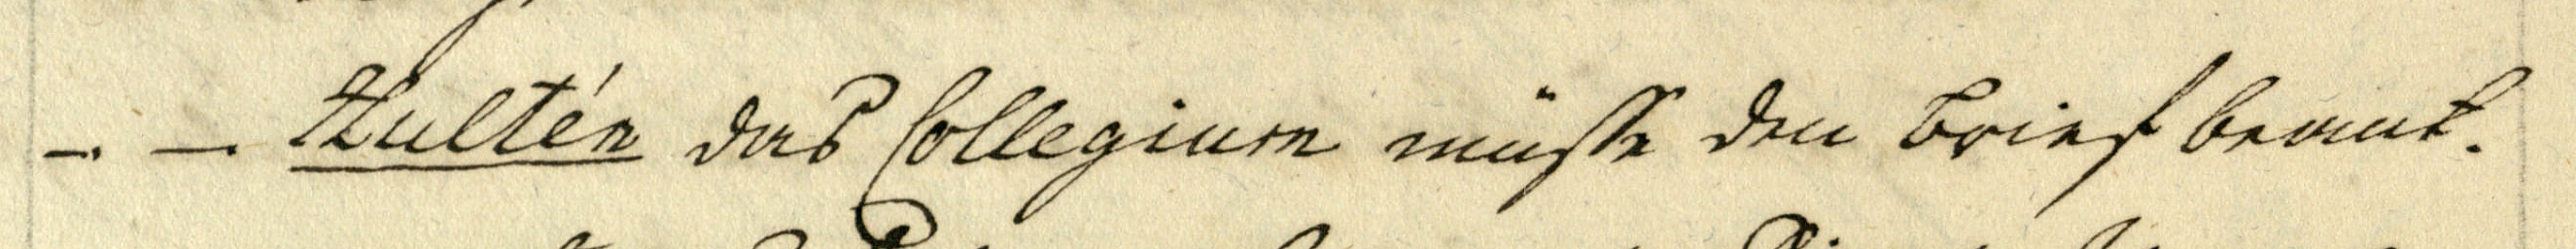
Hultén das Collegium müsse dem Brief beant¬
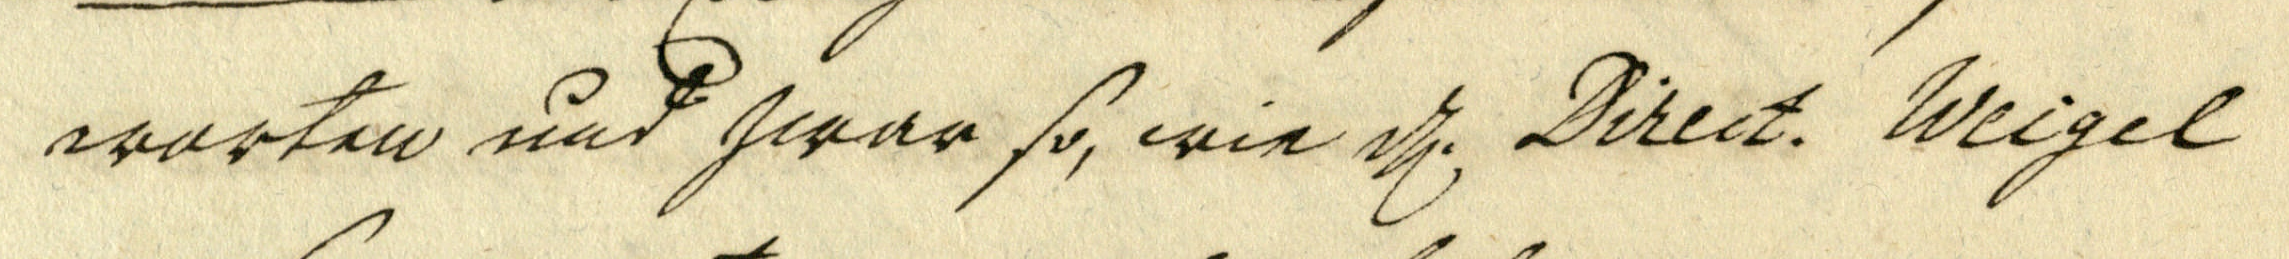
worten und zwar so, wie dh. Direct. Weigel
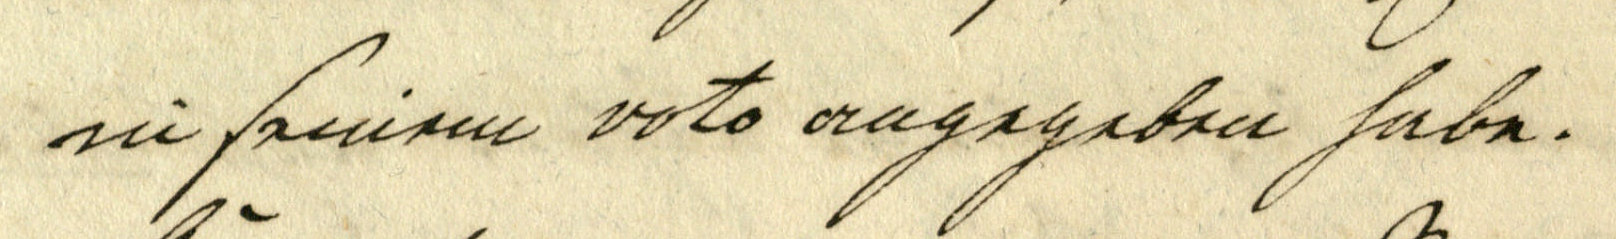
in seinem voto angegeben habe.
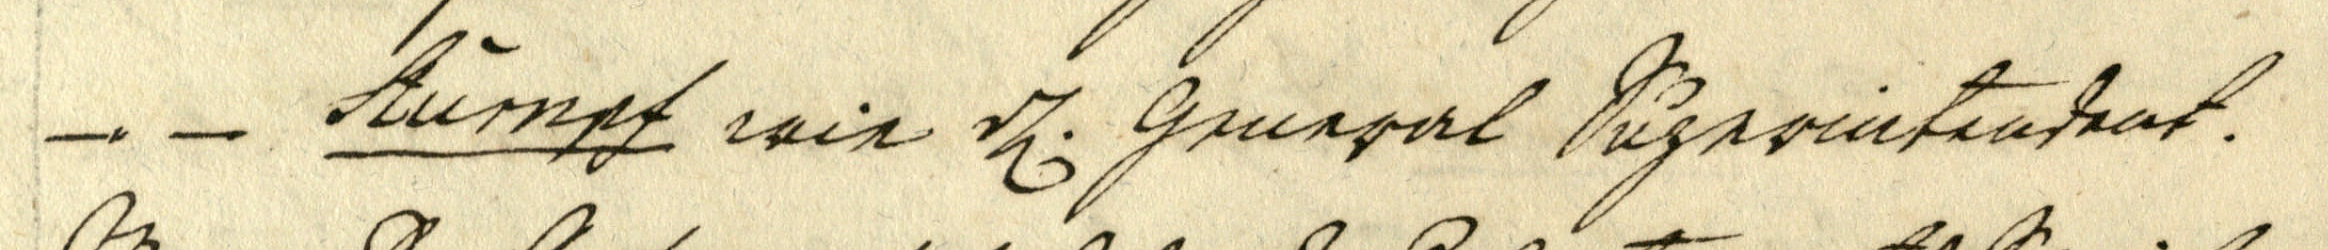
Stumpf wie dh. General Superintendent.
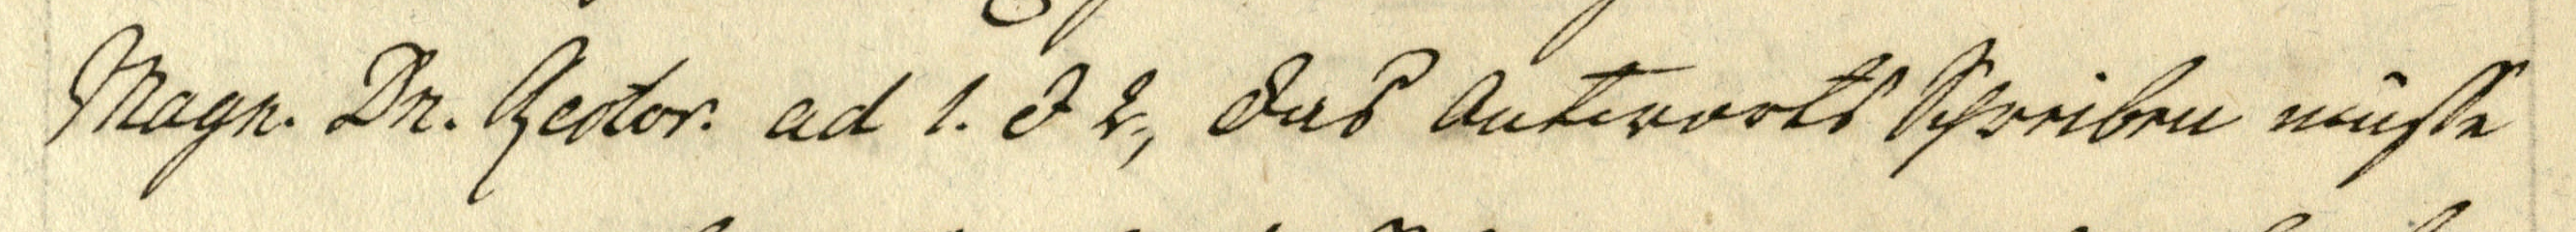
Magn. Dn. Rector: ad 1. et 2, das Antworts Schreiben müsse
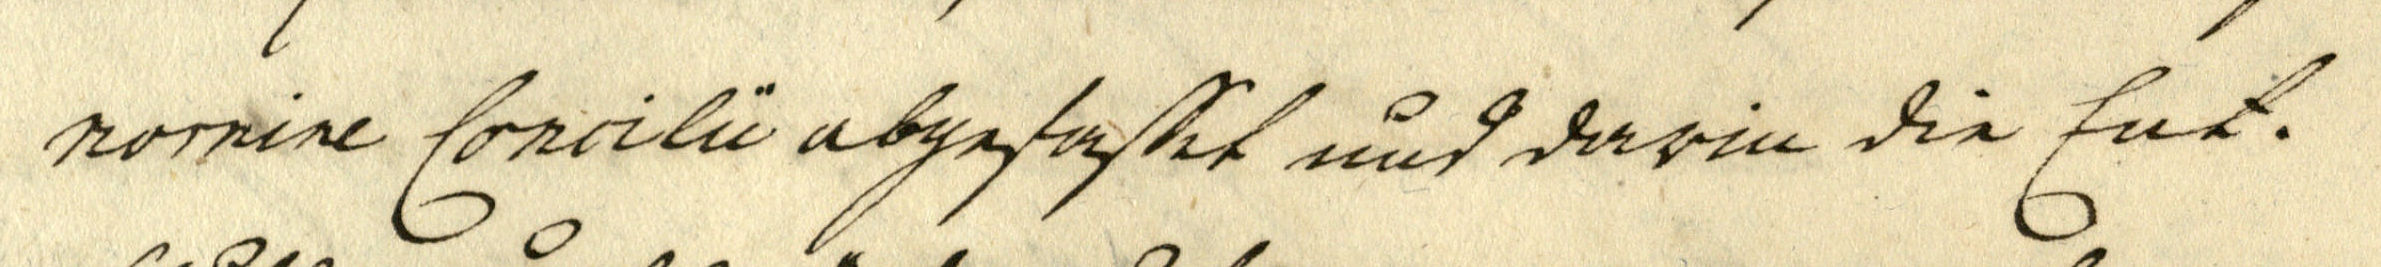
nomine Concilii abgefasset und darin die Ent¬
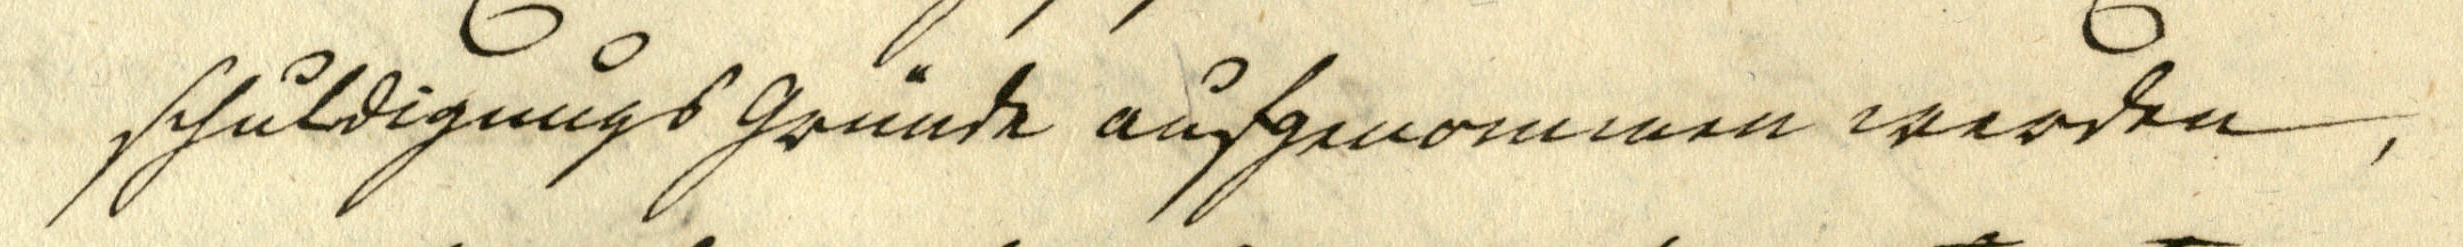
schuldigungs Gründe aufgenommen werden,
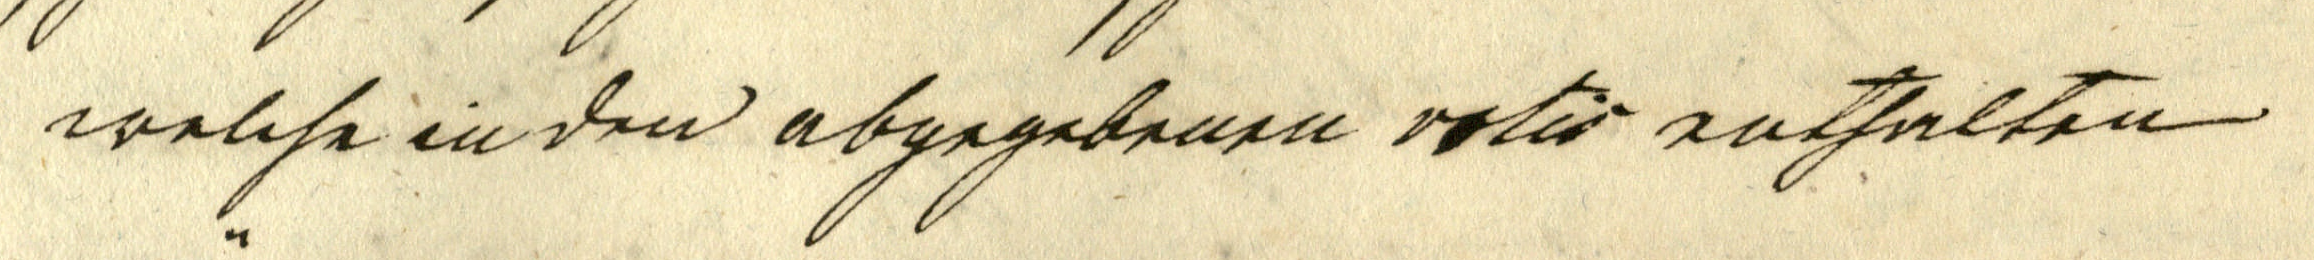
welche in den abgegebenen votis enthalten
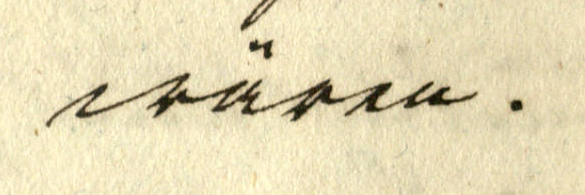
wären.
